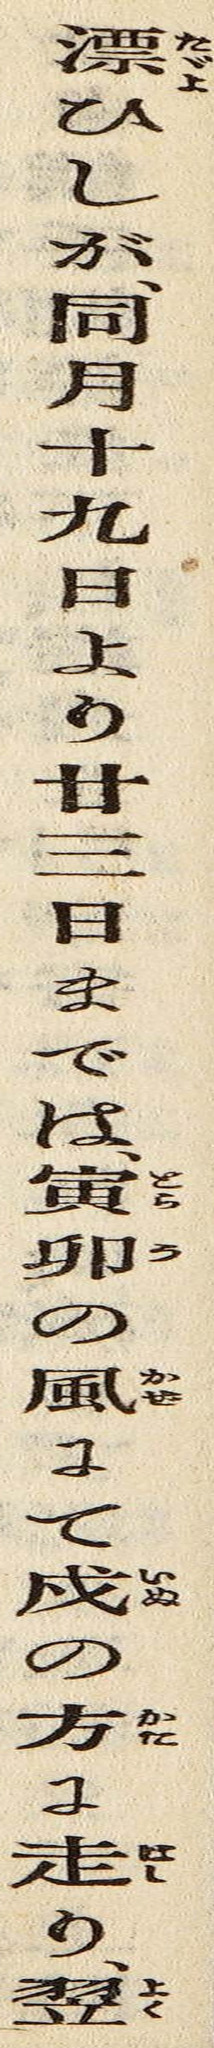漂ひしが、同月十九日より廿三日までは、寅卯の風にて戌の方に走り、翌
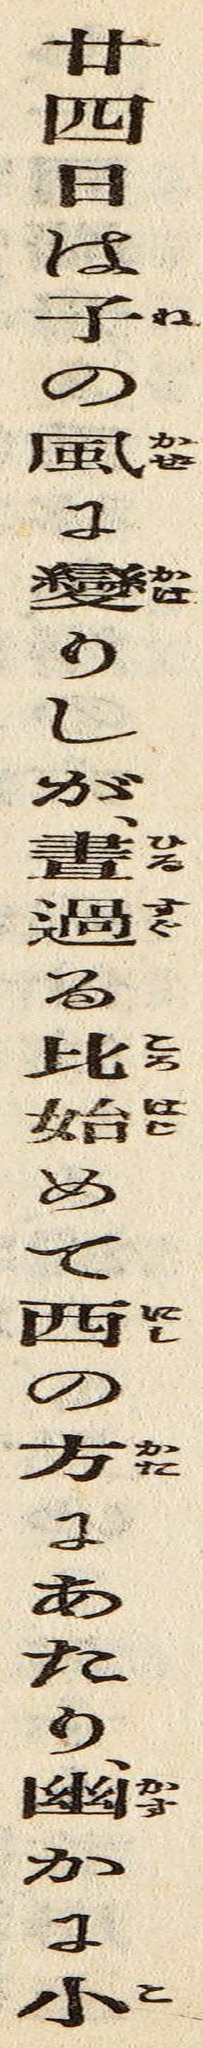廿四日は子の風に変りしが、昼過る比始めて西の方にあたり、幽かに小
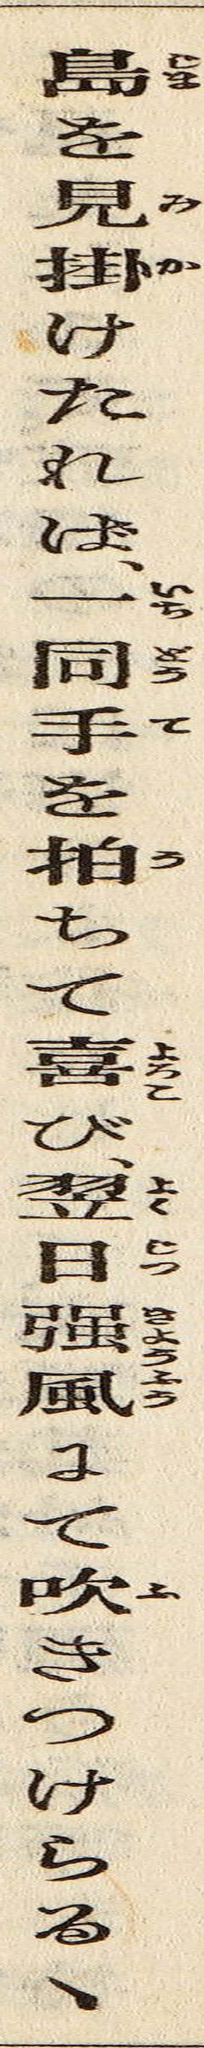島を見掛けたれば、一同手を拍ちて喜び、翌日強風にて吹きつけらるヽ
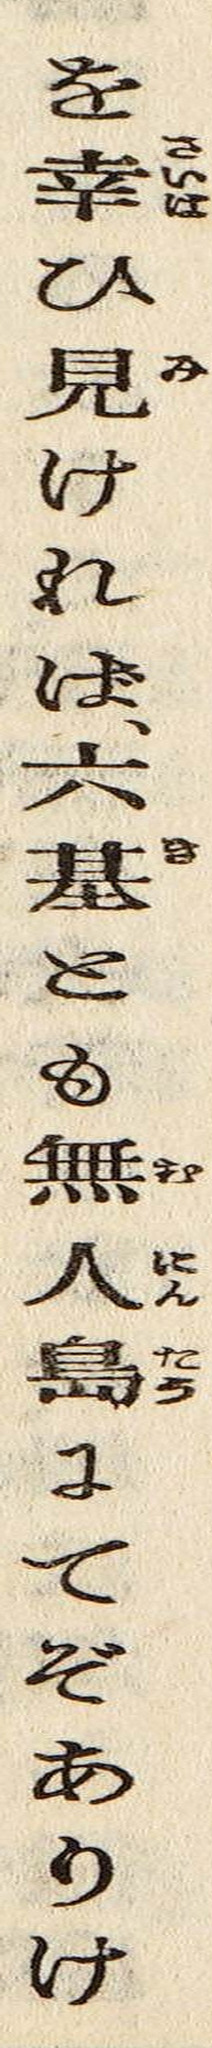を幸ひ見ければ、六基とも無人島にてぞありけ
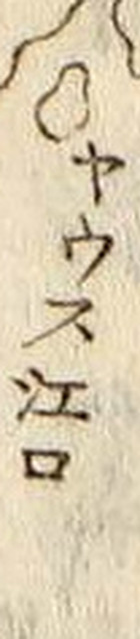ヤウス江口
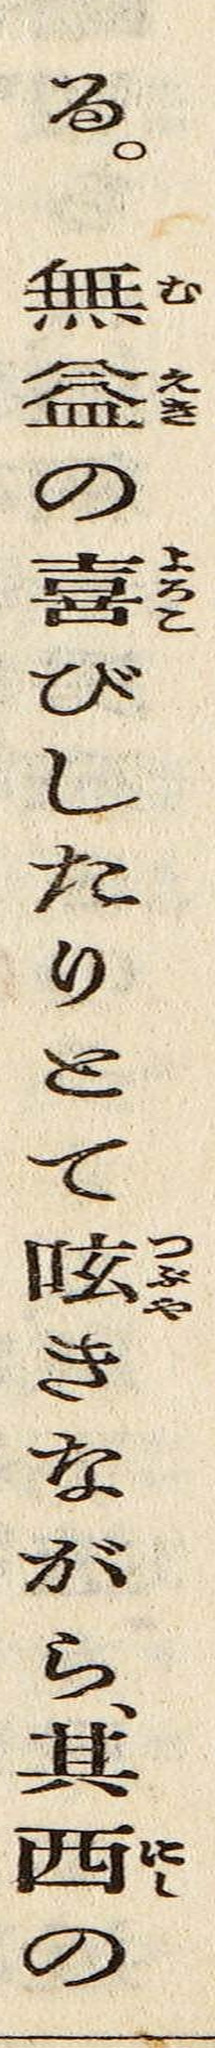る。無益の喜びしたりとて呟きながら、其西の
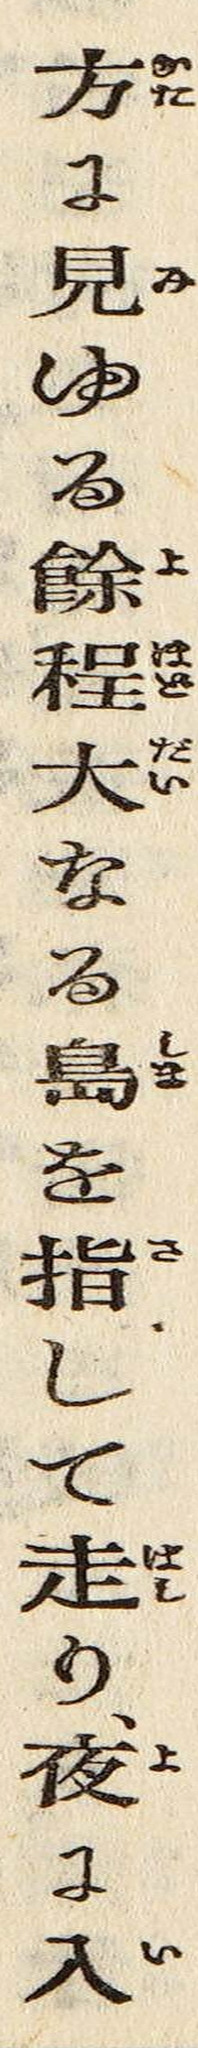方に見ゆる余程大なる島を指して走り、夜に入
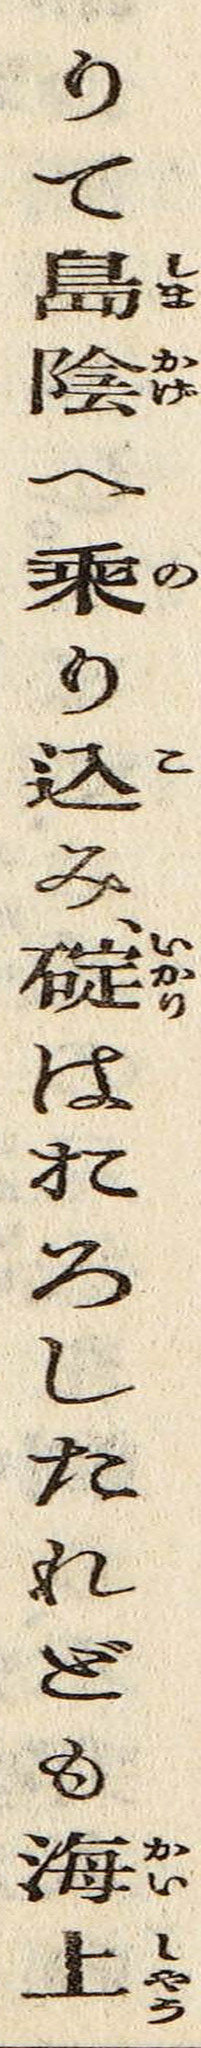りて島陰へ乗り込み、碇はおろしたれども海上
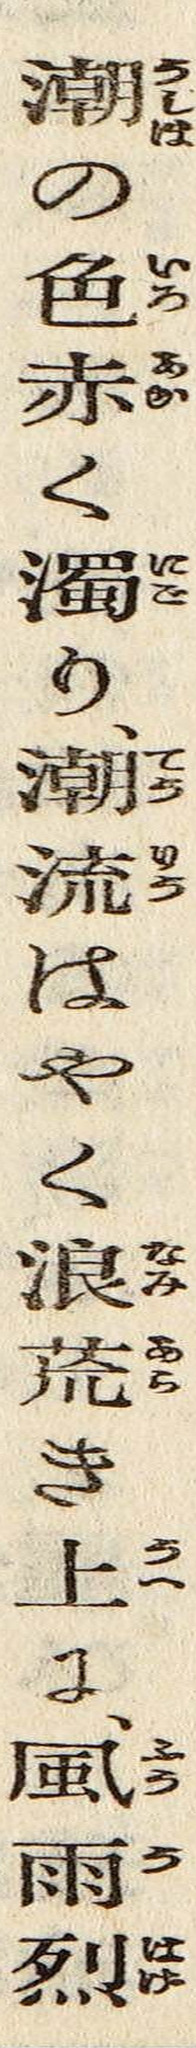潮の色赤く濁り、潮流はやく浪荒き上に、風雨烈
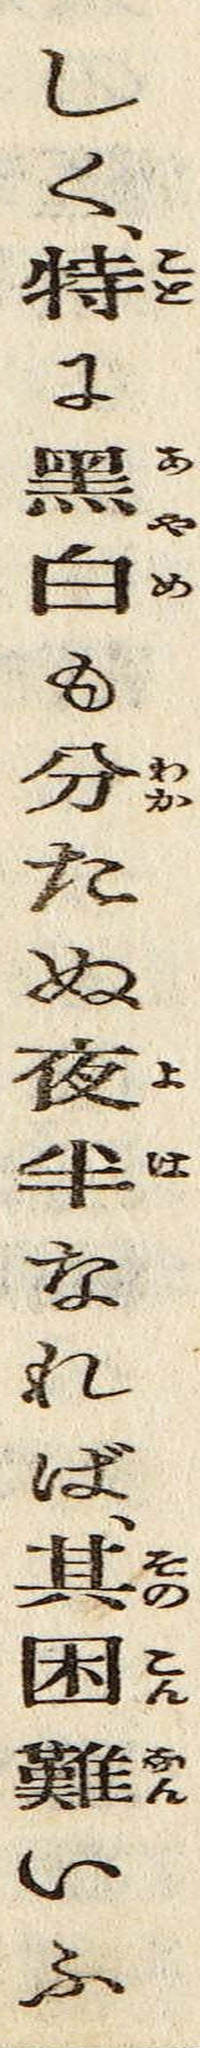しく、特に黒白も分たぬ夜半なれば、其困難いふ
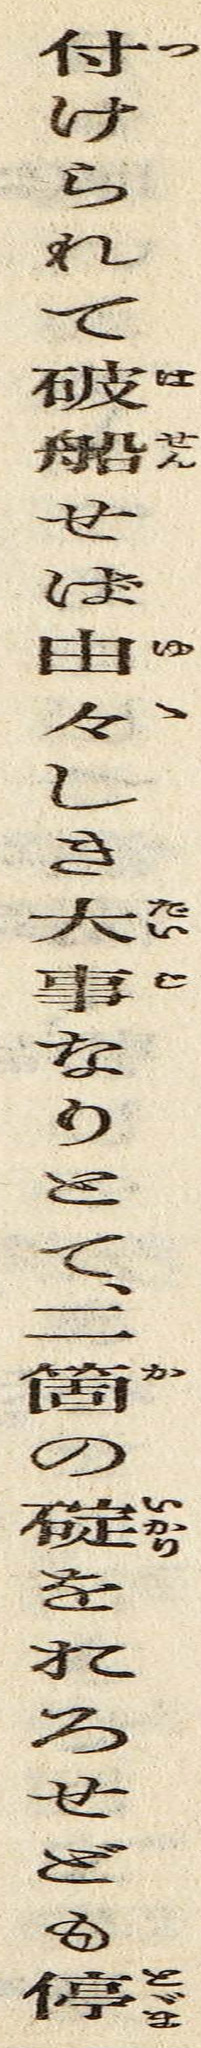付けられて破船せば由々しき大事なりとて、二箇の碇をおろせども停
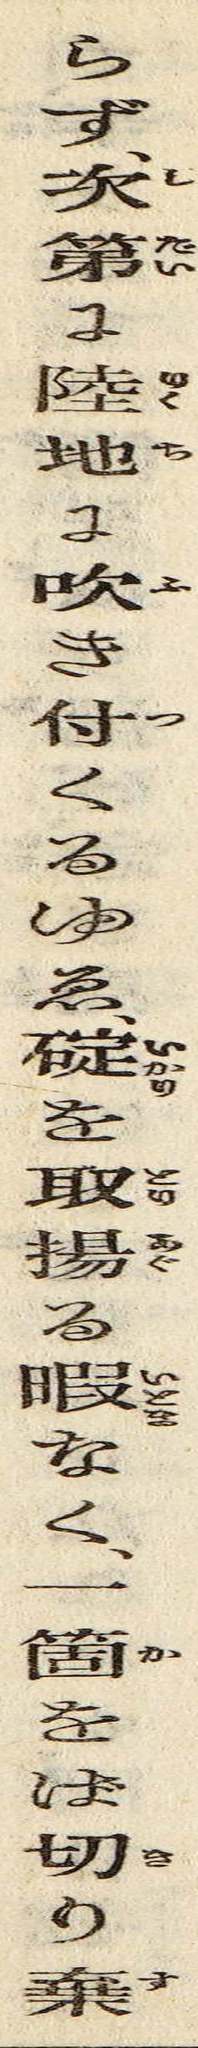らず、次第に陸地に吹き付くるゆゑ、碇を取揚る暇なく、一箇をば切り棄

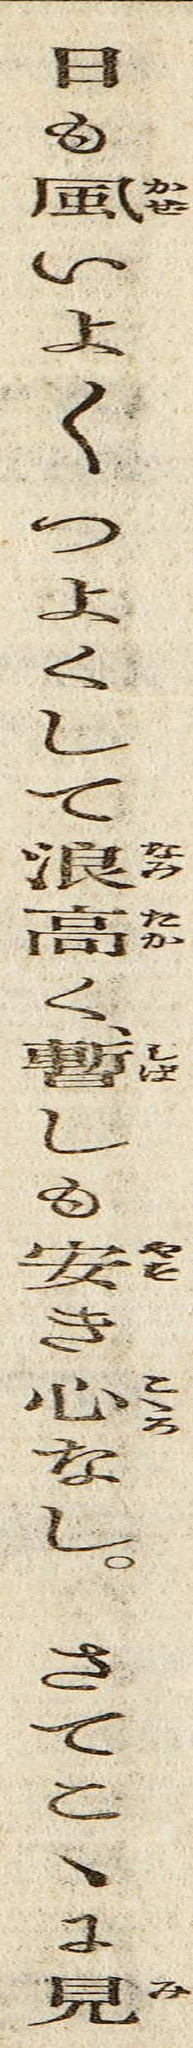日も風いよ〳〵つよくして浪高く、暫しも安き心なし。さてこヽに見
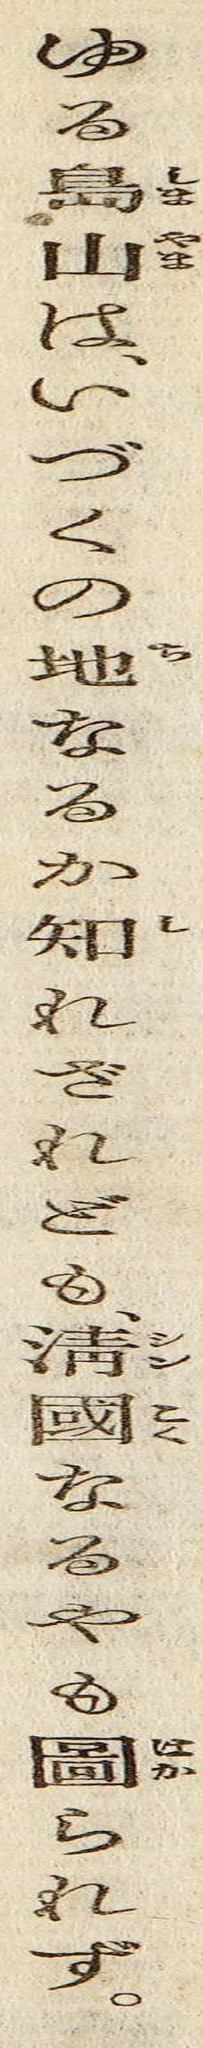ゆる島山は、いづくの地なるか知れざれども、清国なるやも図られず。
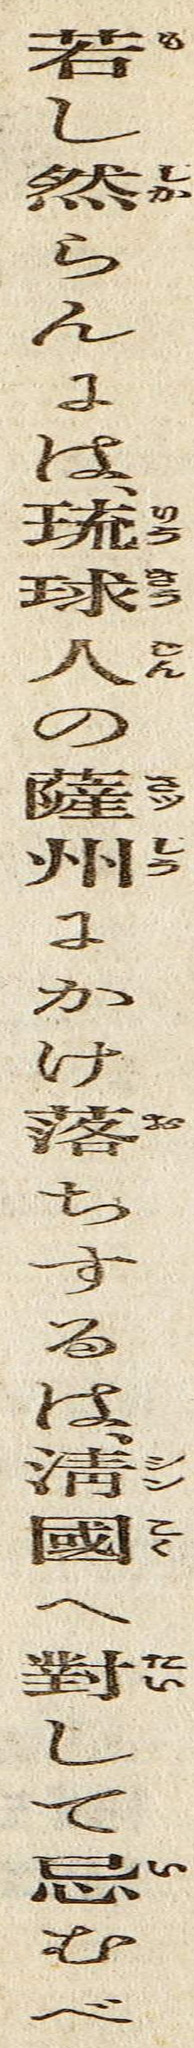若し然らんには、琉球人の薩州にかけ落ちするは、清国へ対して忌むべ
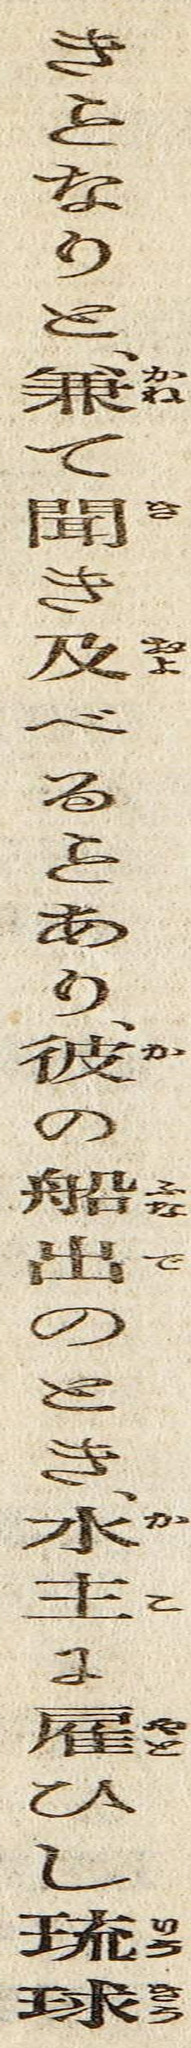きことなりと、兼て聞き及べることあり、彼の船出のとき、水主に雇ひし琉球
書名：日本漂流譚
